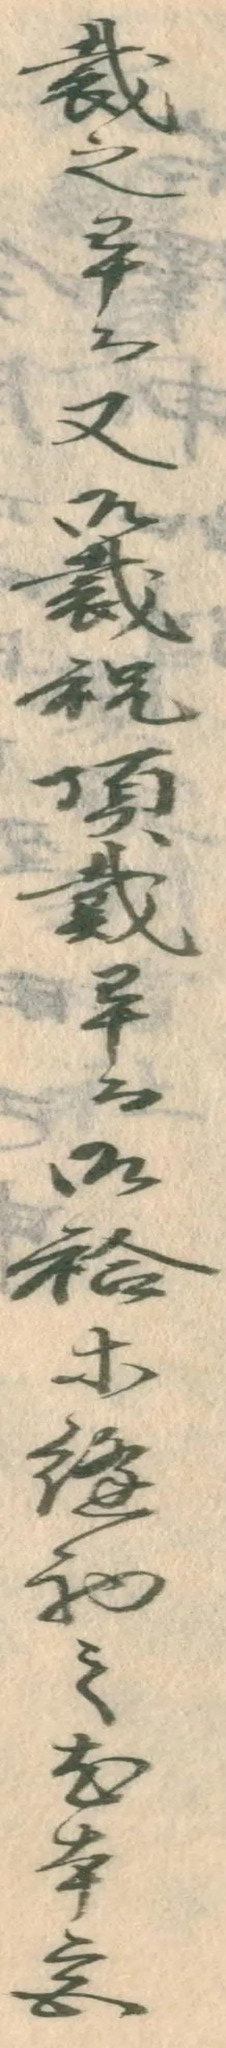裁之畢而又御裁祝頂戴畢而御袷等縫初之尤本宮
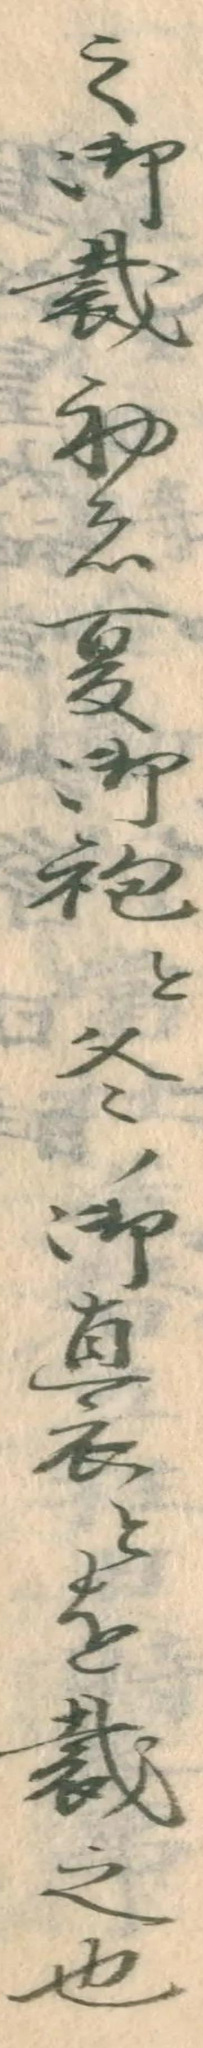之御裁初は夏御袍と冬ノ御直衣とを裁之也
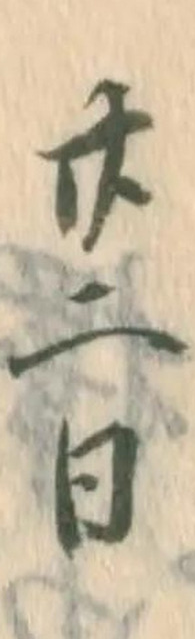廿二日
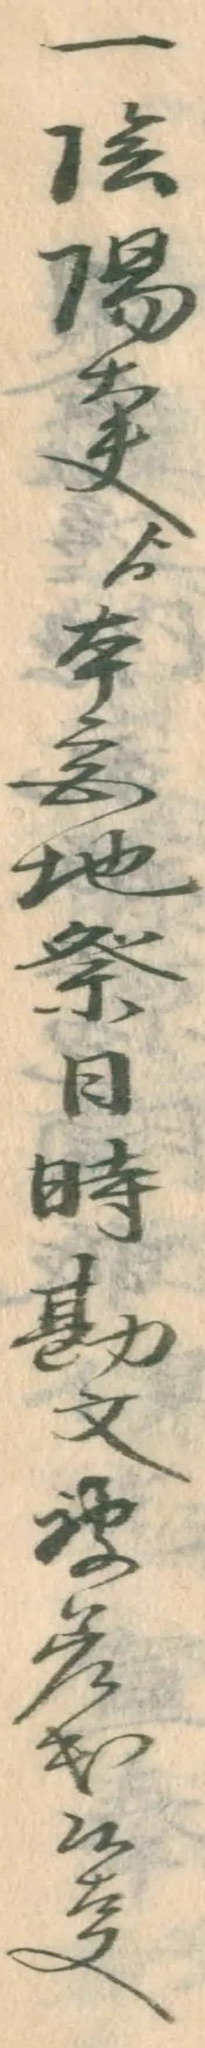一陰陽大夫ゟ本宮地祭日時勘文被差出候事

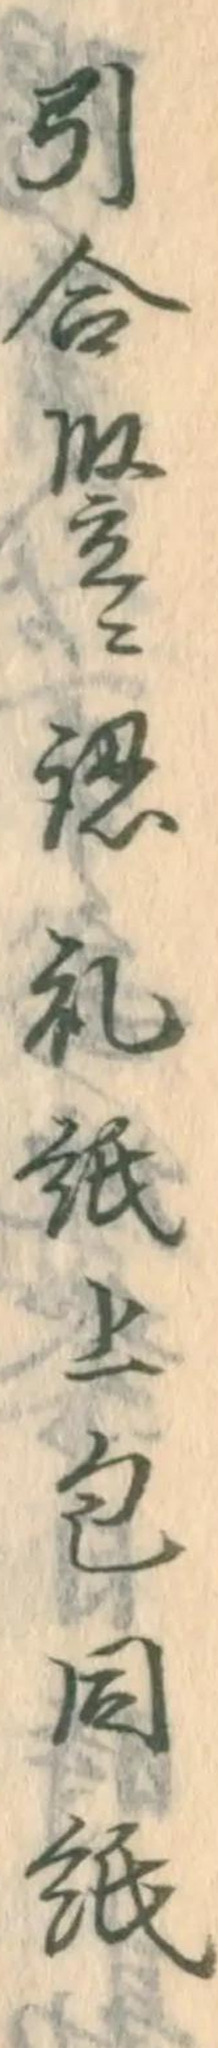引合竪ニ認礼紙上包同紙
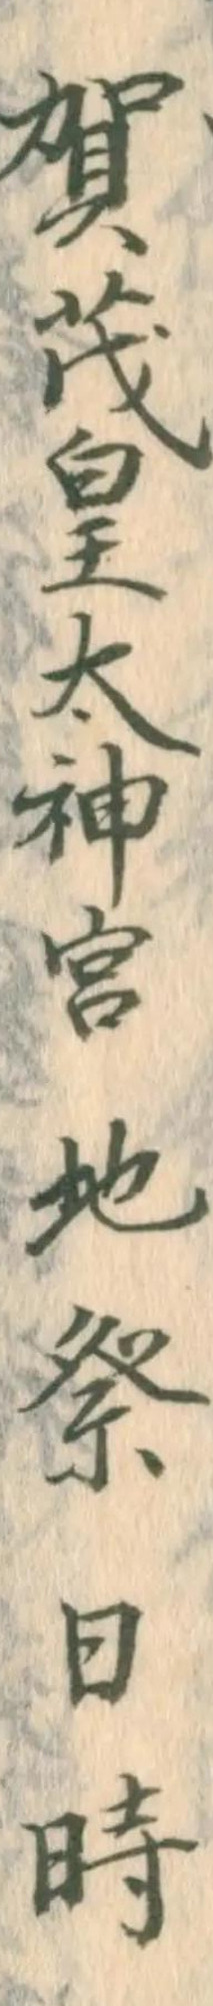賀茂皇太神宮地祭日時
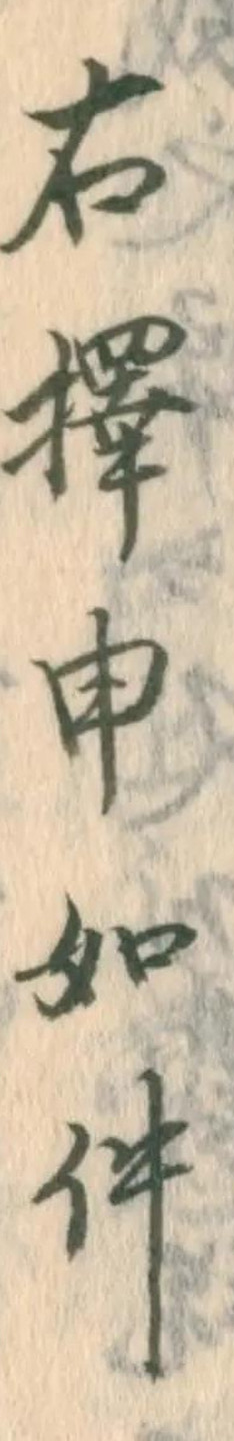右択申如件
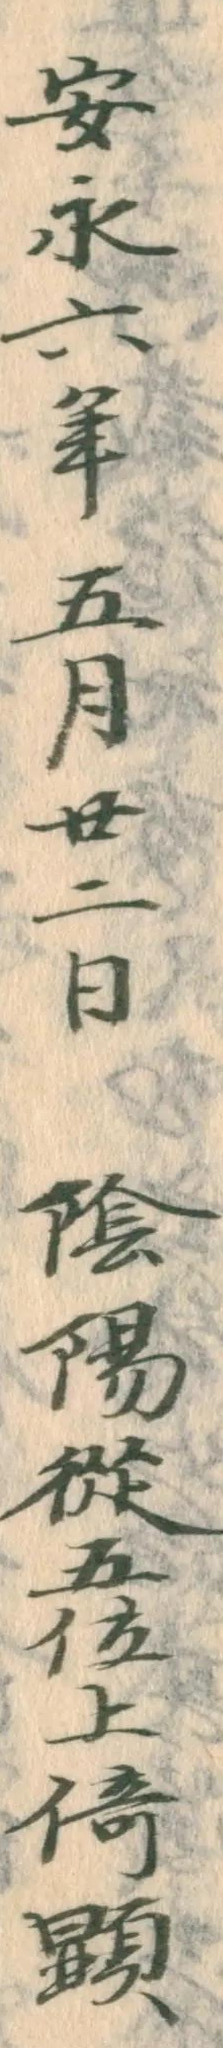安永六年五月廿二日陰陽從五位上倚顕
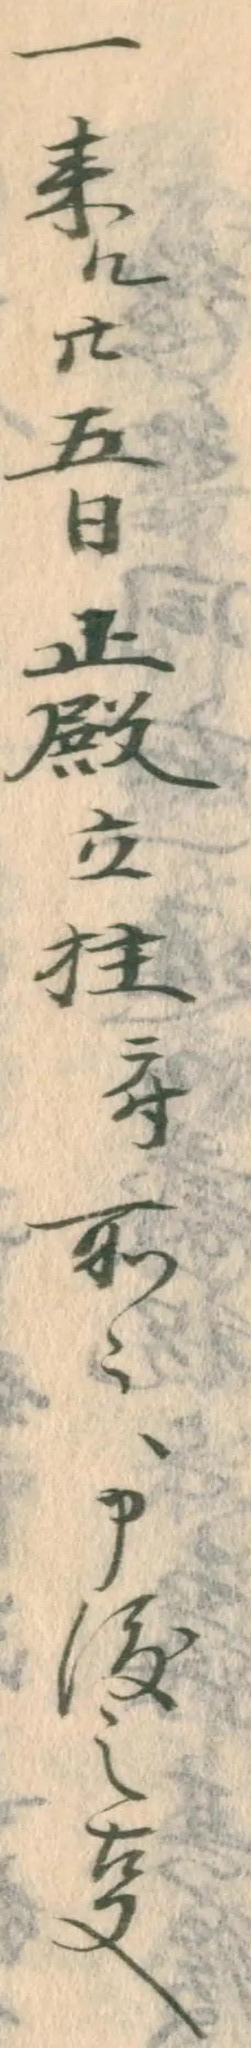一来ル廿五日正殿立柱ニ付所々へ申渡之事
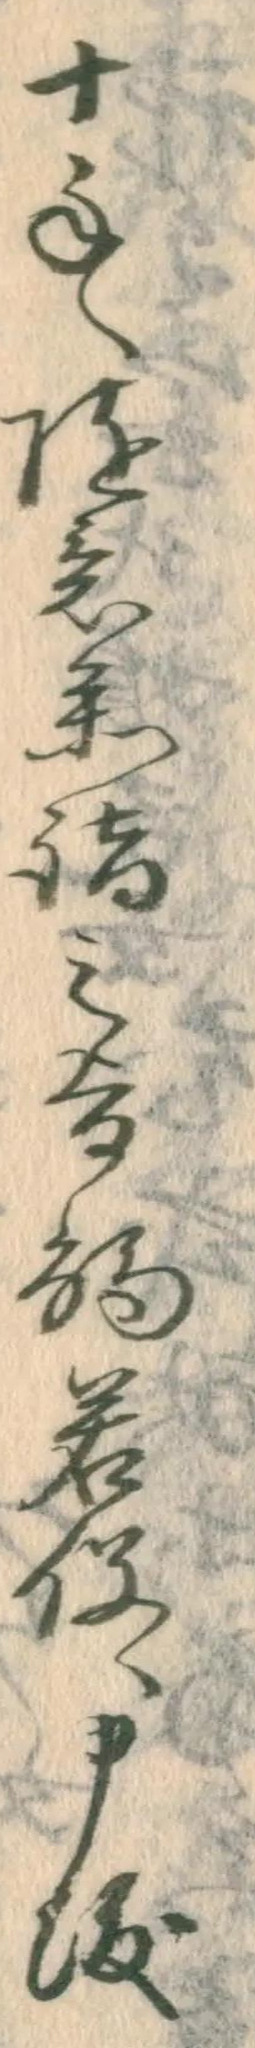十手へ随意参詣之旨触若役へ申渡
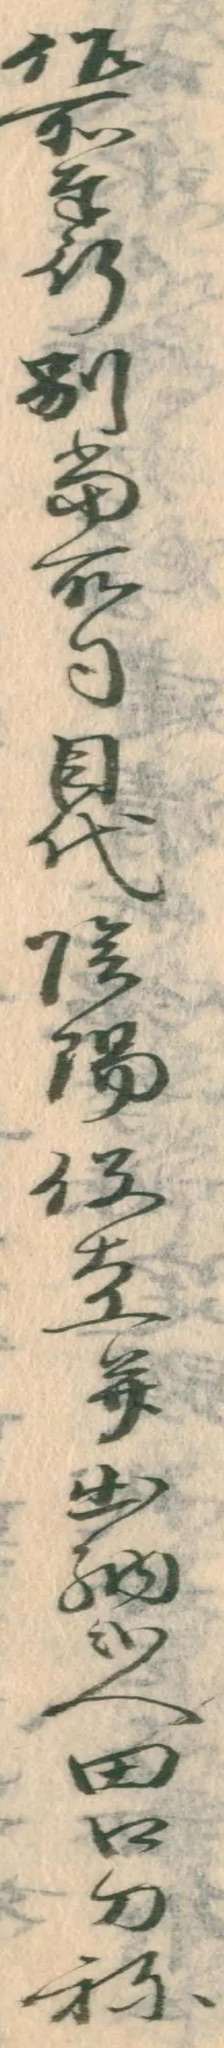作所奉行別当所司目代陰陽役大工并出納弐人田口刀祢
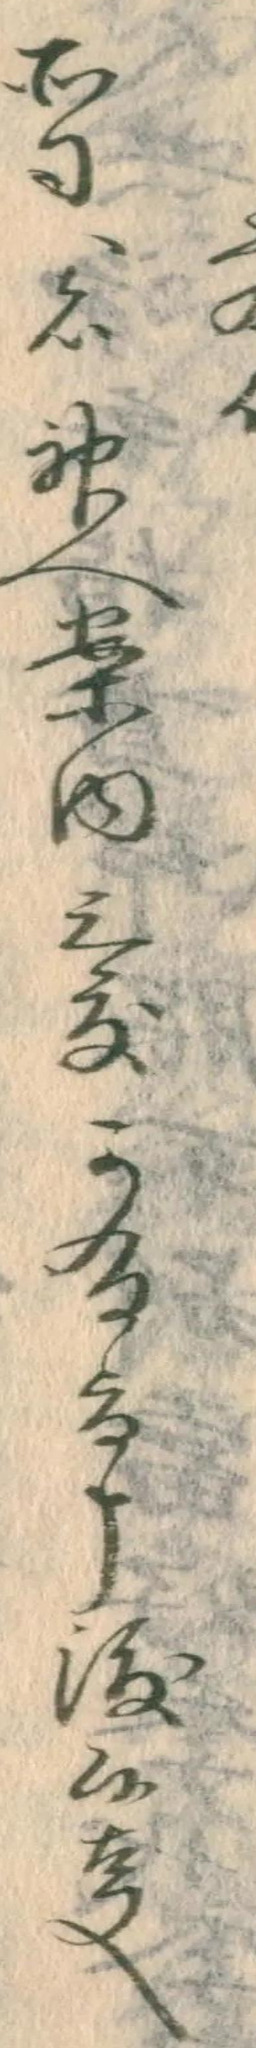所司へは神人案内三度可有旨申渡候事
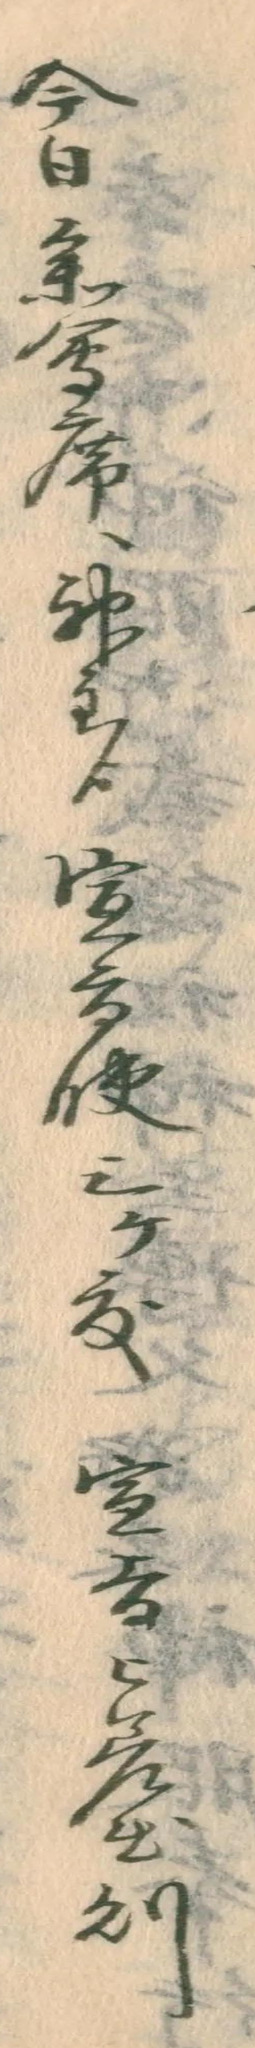一今日参会席へ神主ゟ宣旨使三ケ度宣旨被差出則
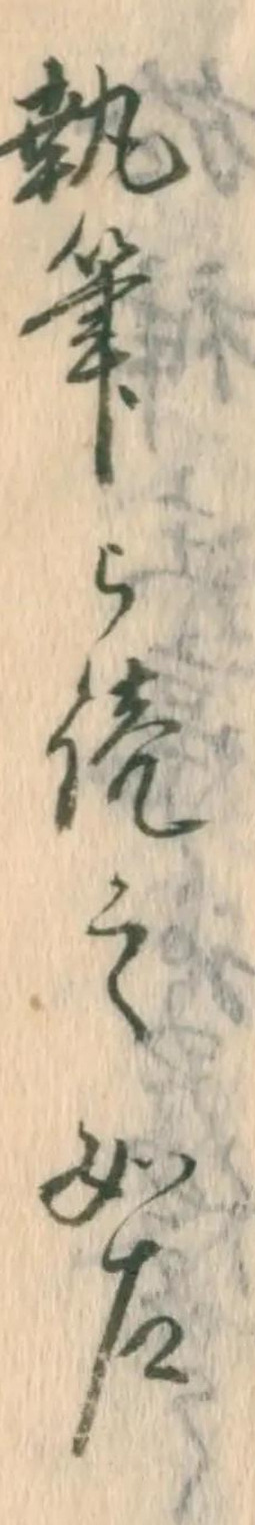執筆被読之如左
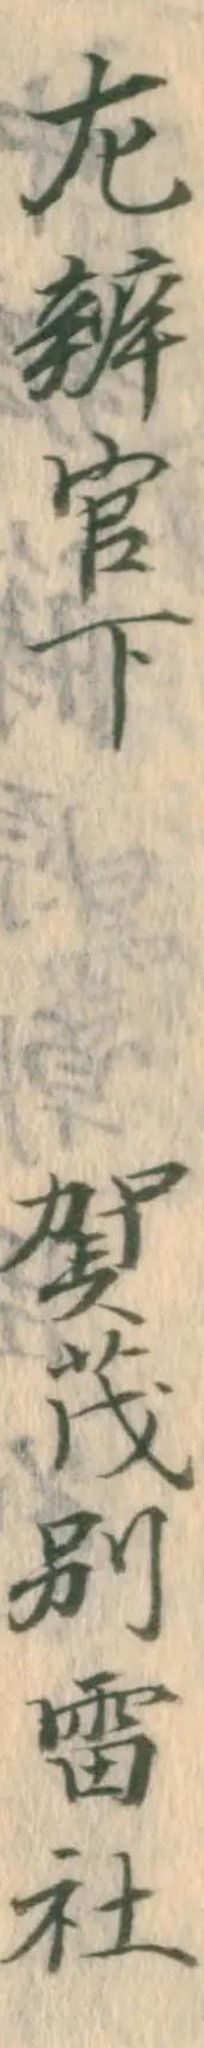左弁官下賀茂別雷社
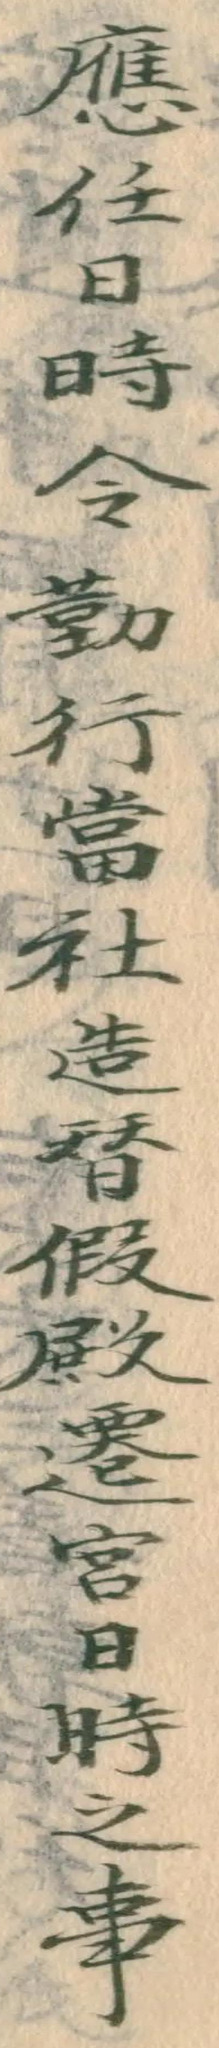応任日時令勤行当社造替仮殿遷宮日時之事
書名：賀茂社記録. 第17冊
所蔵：国立国会図書館 National Diet Library, JAPAN
